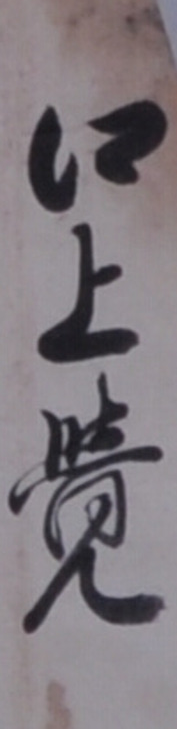口上覚
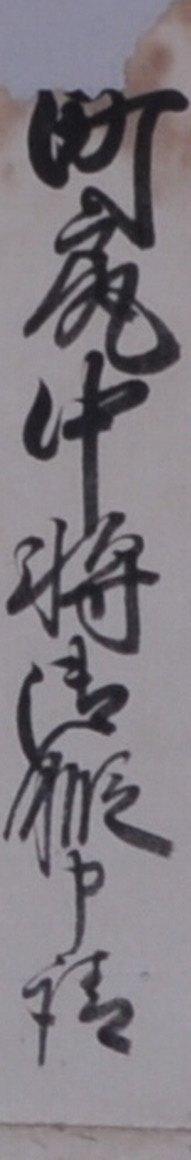町尻中将御暇申請
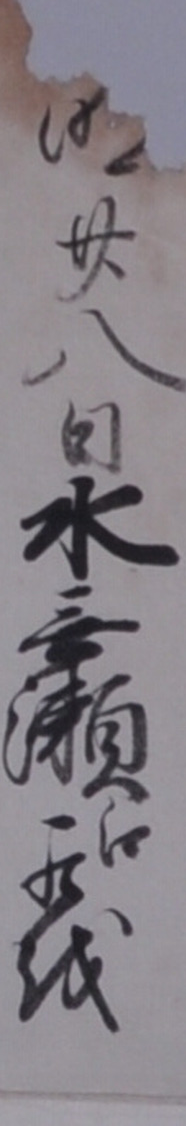明廿八日水無瀬え罷越
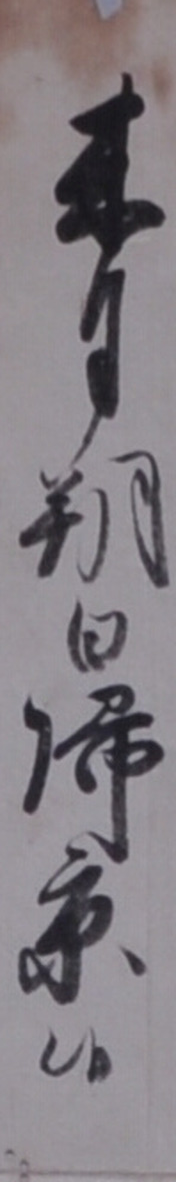来月朔日帰京候
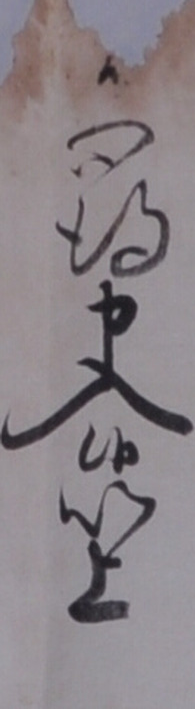心得申入候以上
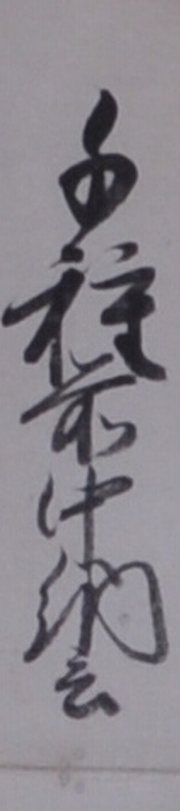千種前中納言
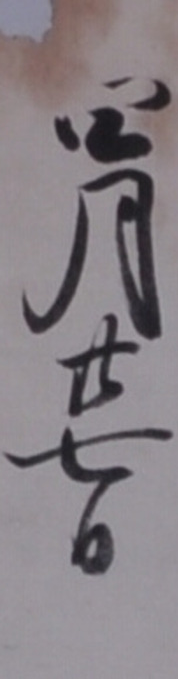四月廿七日
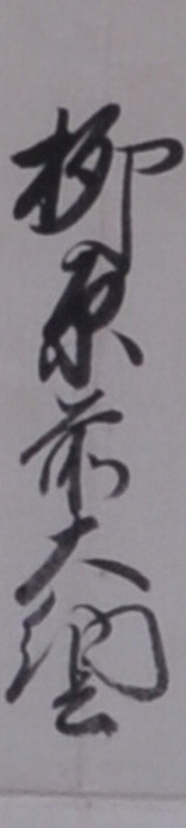柳原前大納言
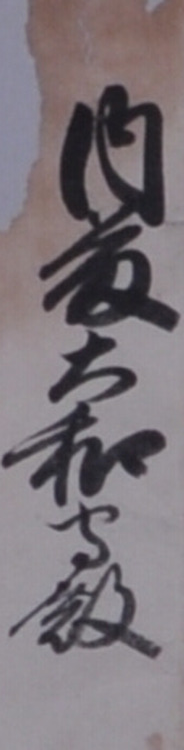内藤大和守殿
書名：口上覚
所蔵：伊那市立高遠町図書館・合同会社AMANE
